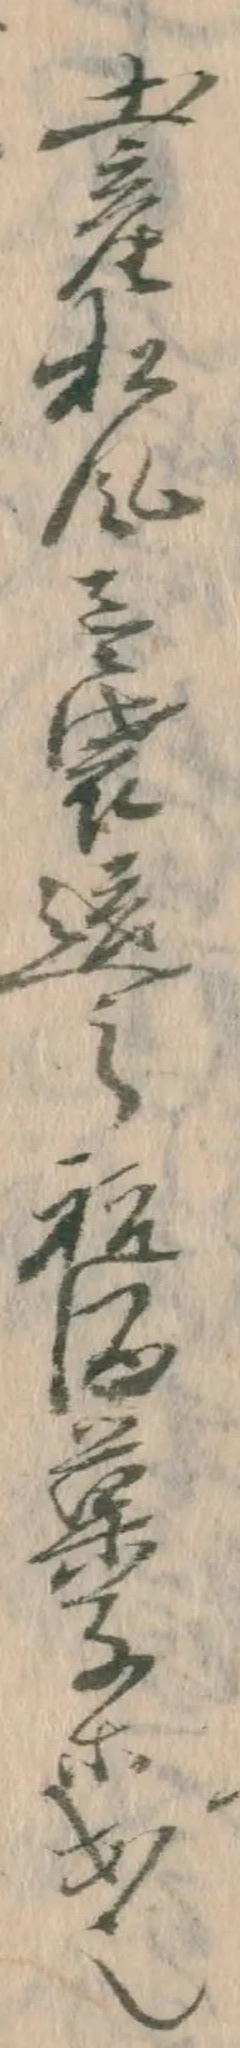土産松風壱袋送之祝酒菓子等等出也
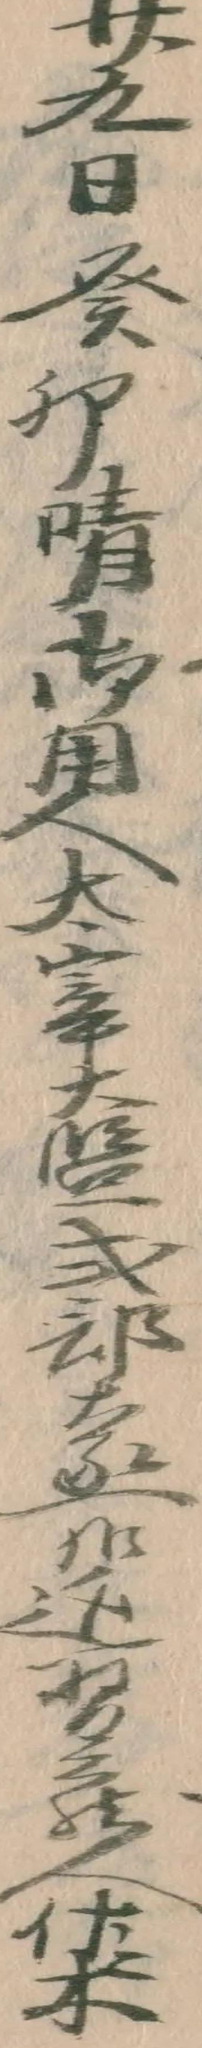廿九日癸卯晴御用人太宰大監式部大丞御追習蔵人佐々木
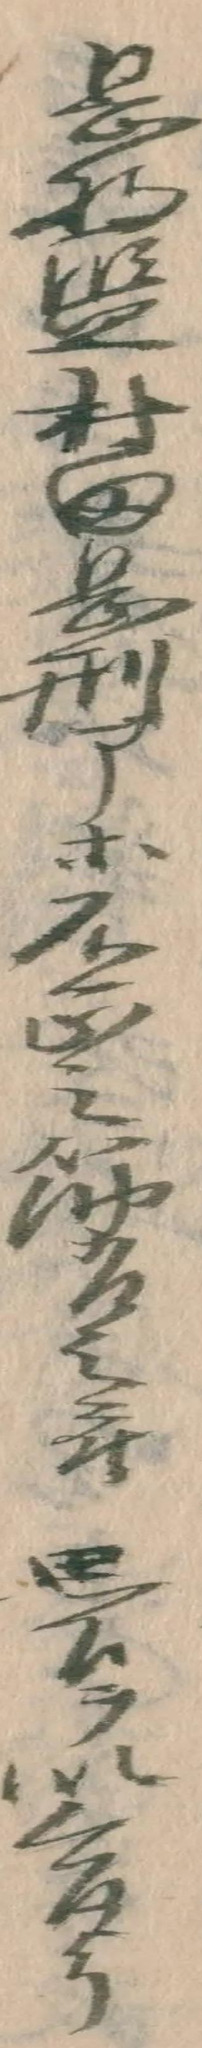殿将監村田殿刑部等不正之筋有之ニ付思召ヲ以今日より
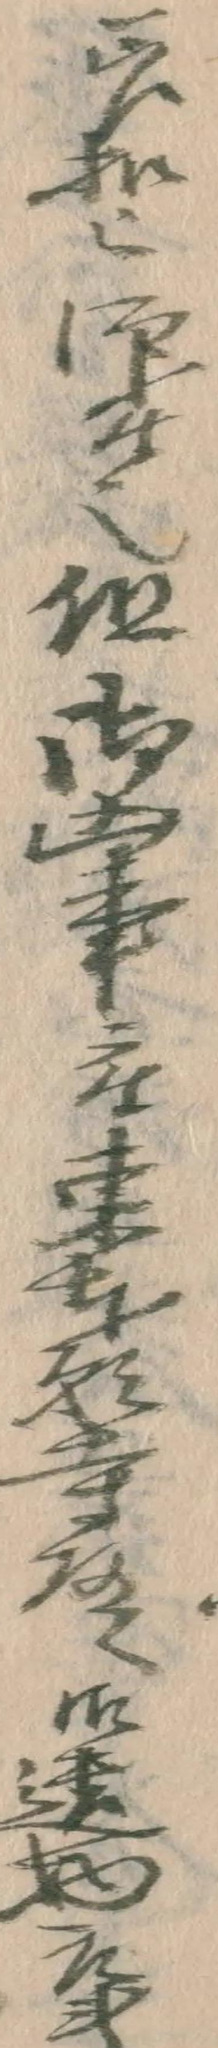差押被仰付之但御凶事ニ付東本願寺殿へ御遺物取斗
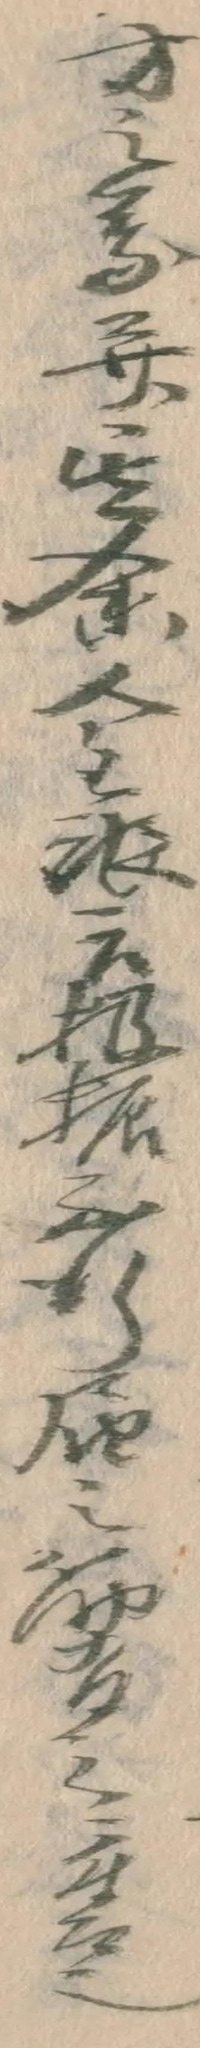方之義幷其余金銀取扱振不行届之筋有之ニ付而也
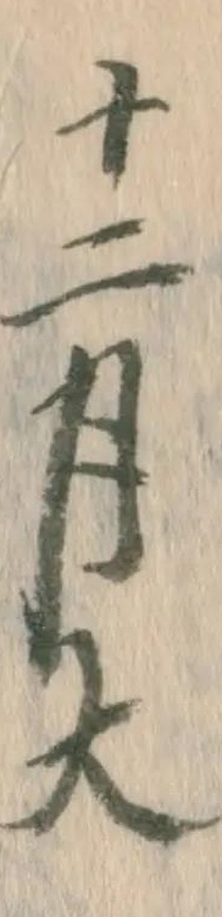十二月大
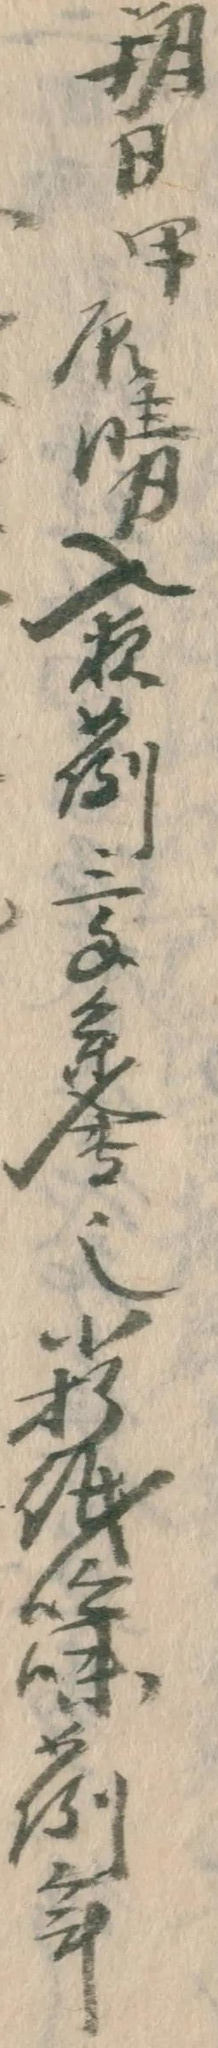朔日甲辰晴入夜如例三手参會也小折紙吟味如例年
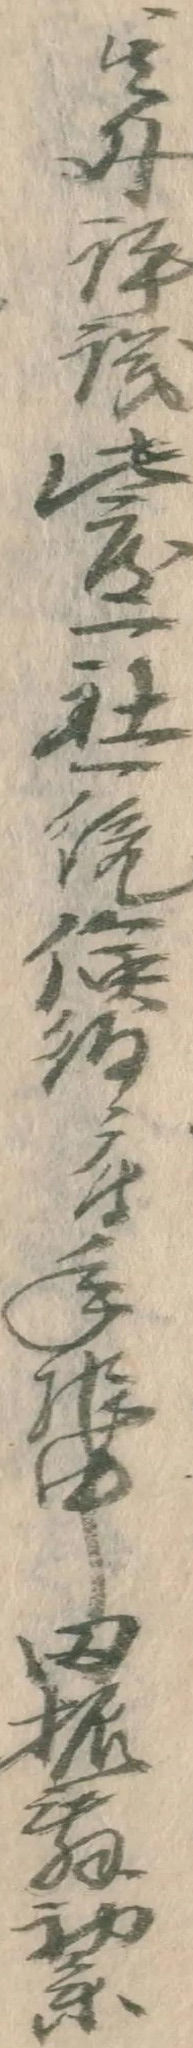其外評議此度一社一統倹約ニ付年限中田振舞初参
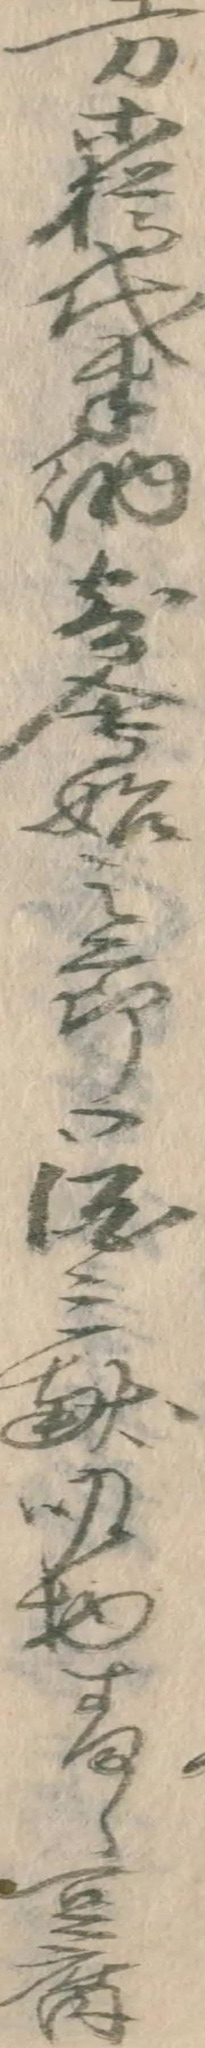方等樽代半納寄會始之節御酒三献明物すまし豆腐
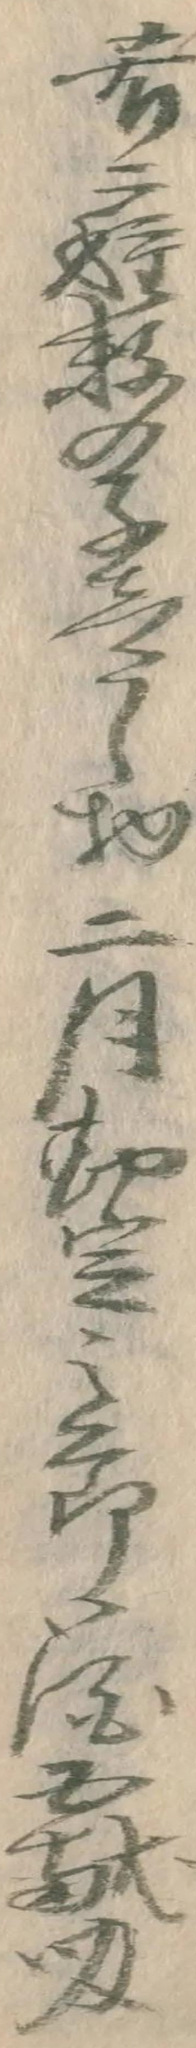肴二種数の子ひたし物二月勘定之節御酒五献吸

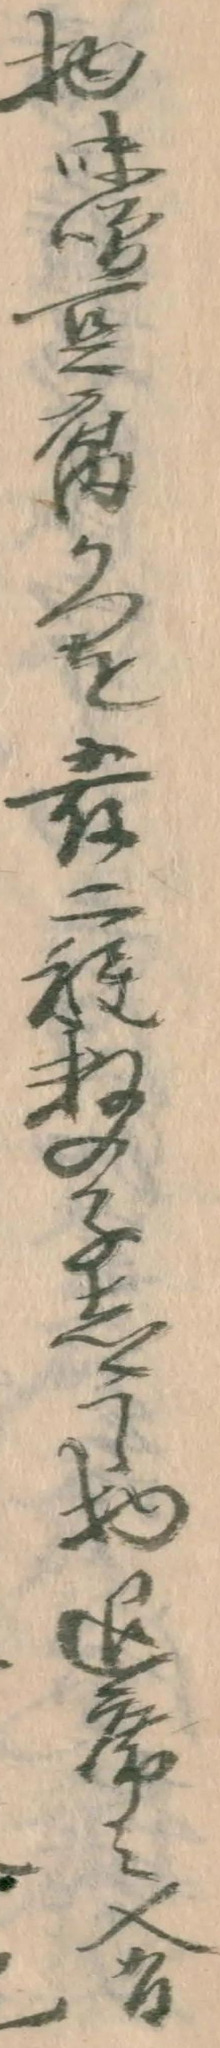物味噌豆腐かつを肴二種数の子したし物退席之入有
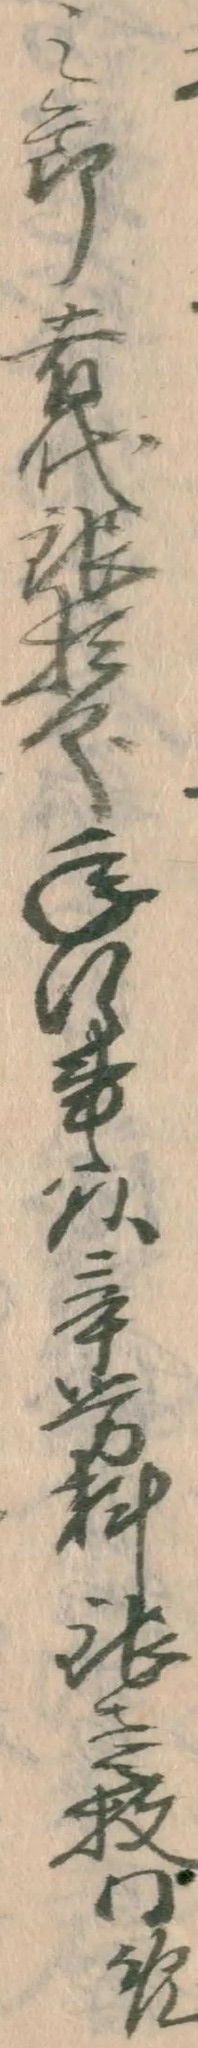之節肴代銀拾匁年行事限頭労料銀壱枚同館
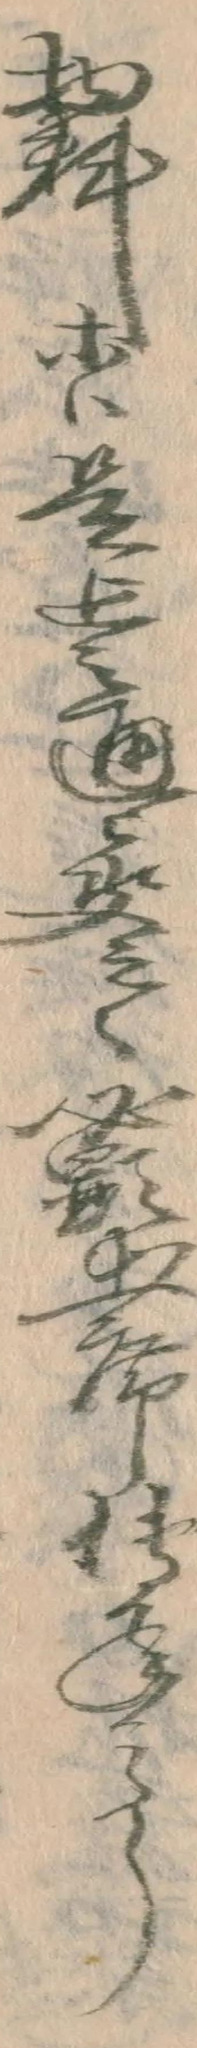物料等ハ是迄之通被決之候必顕出席傳承之了
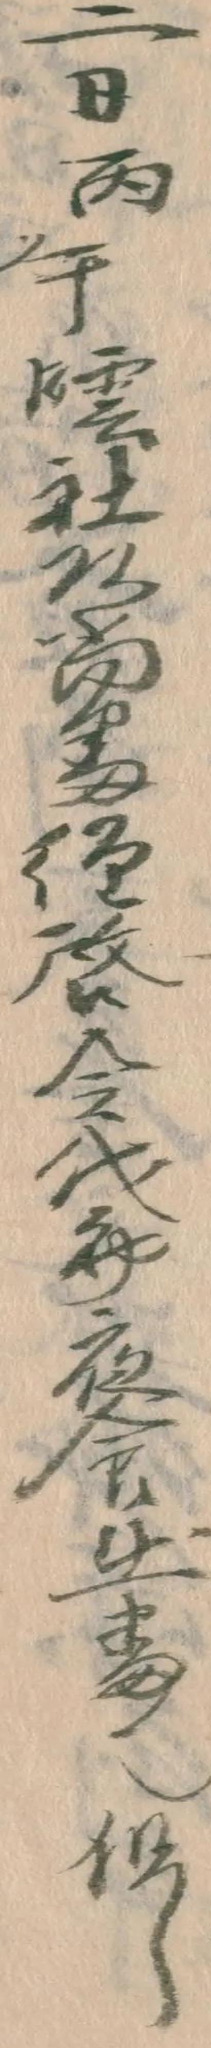三日丙午曇社頭當番経啓令代斉夜食出番也但し
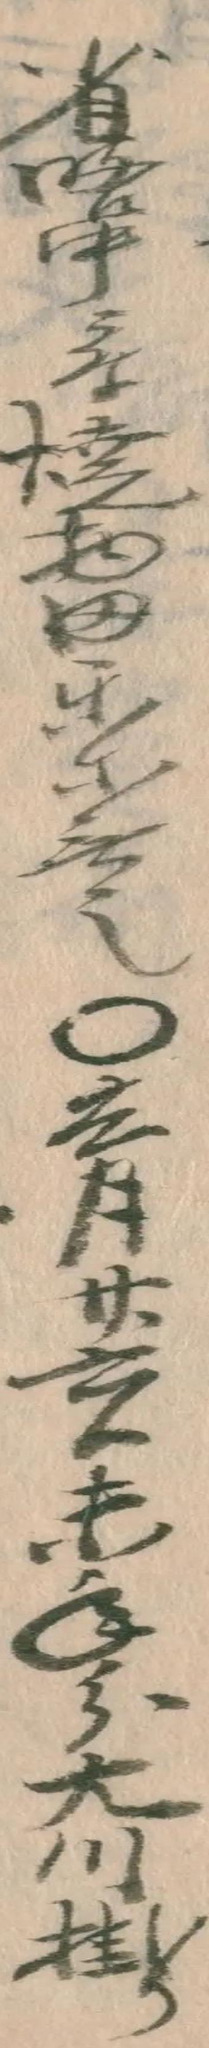省略中ニ付焼物田楽無之○去月廿六日未年分大川掛り
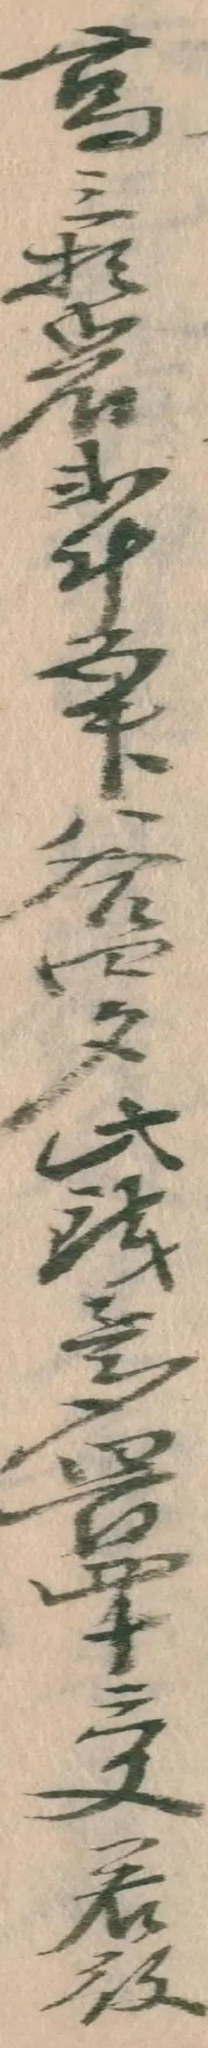高三拾弐石弐斗五升八合四勺此残壱〆四百四十三文若役
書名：賀茂社記録. 第67冊
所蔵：国立国会図書館 National Diet Library, JAPAN
